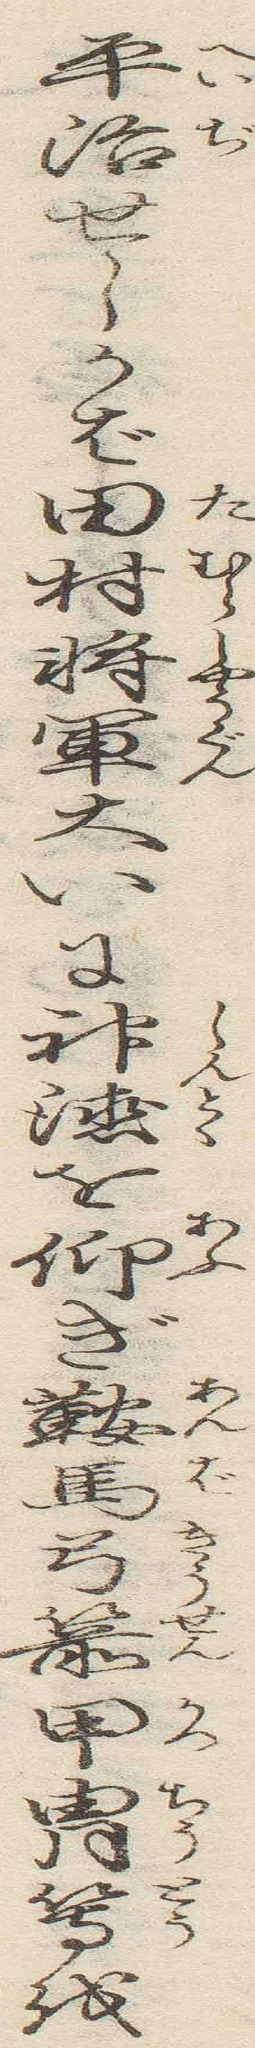平治せしかば田村将軍大いに神德を仰ぎ鞍馬弓箭甲冑等を
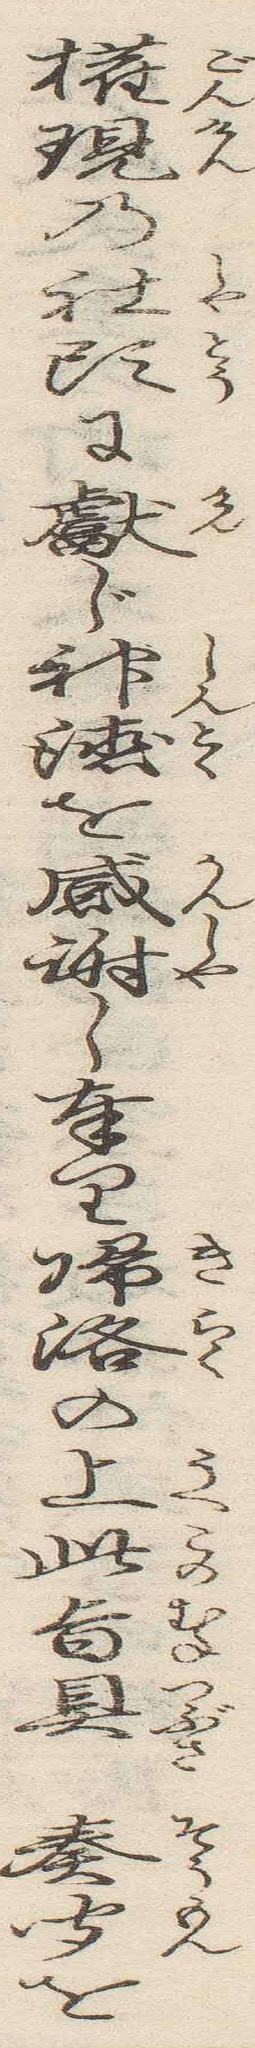權現の社頭に獻じ神德を感謝し奉り帰洛の上此旨具奏聞を
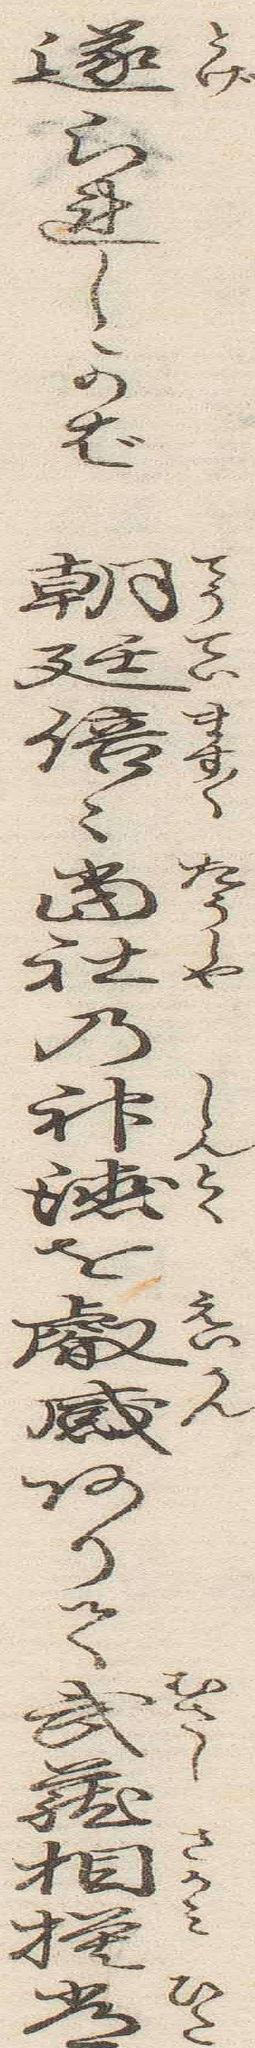遂られしかば朝廷倍〻當社の神德を叡感ありて武蔵相模常
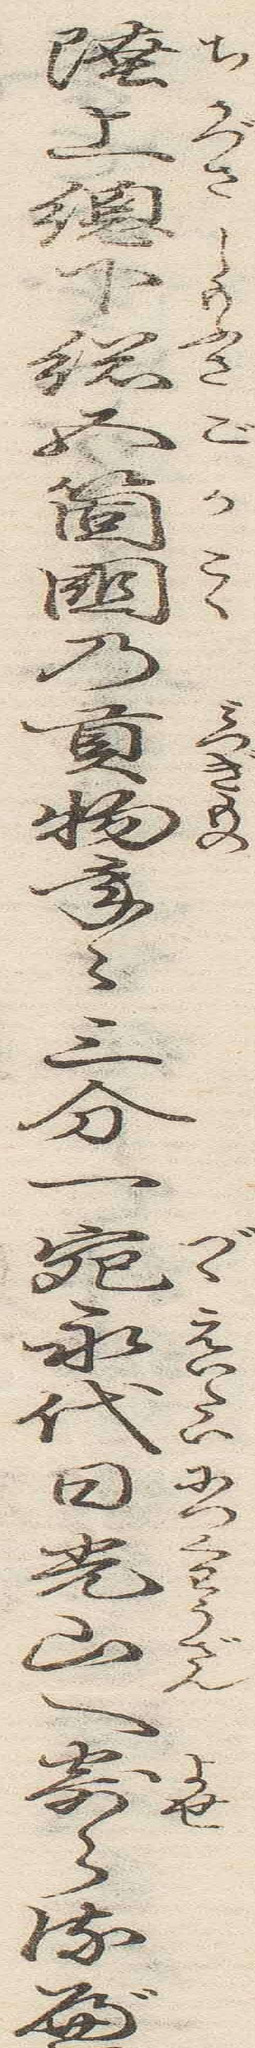陸上總下総五箇國の貢物年〻三分一宛永代日光山へ寄らるべ
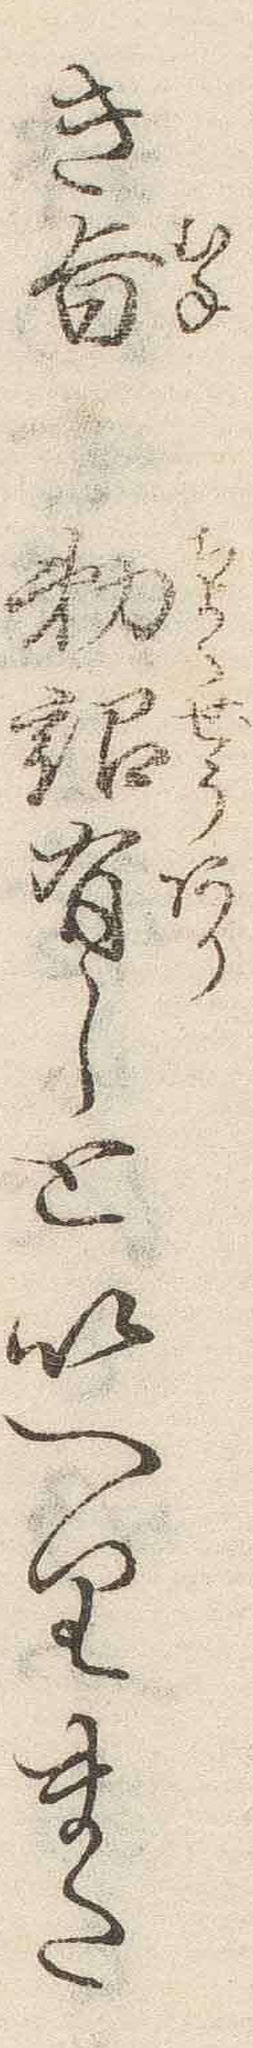き旨勅詔有しといへりまた
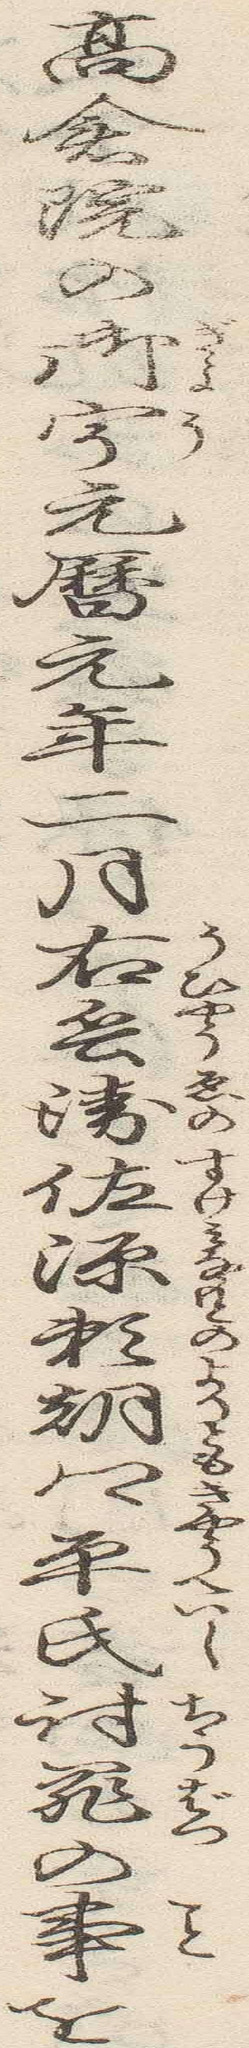高倉院の御宇元歷元年二月右兵衛佐源頼朝卿平氏討罪の事を
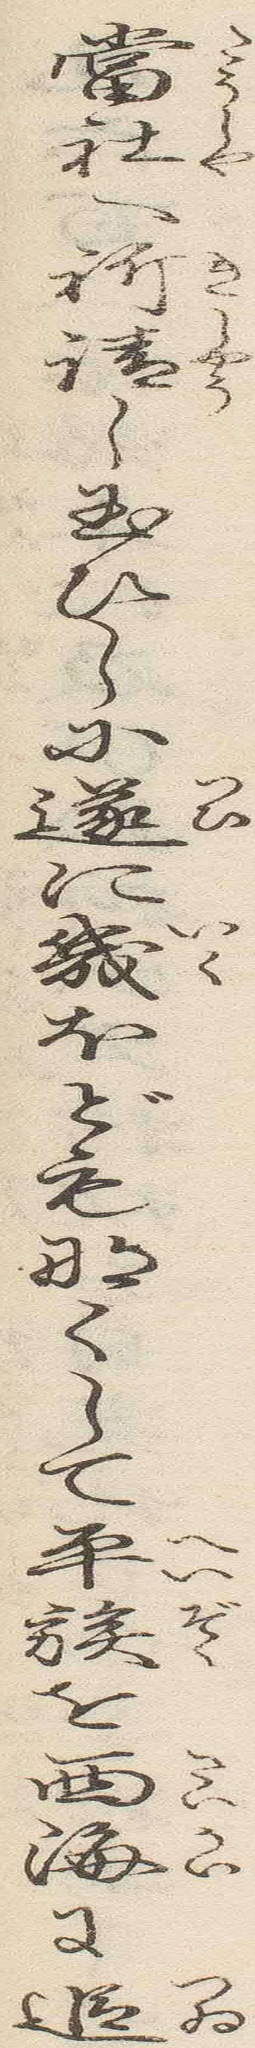當社へ祈請し玉ひしに遂に幾ほどもなくして平族を西海に追
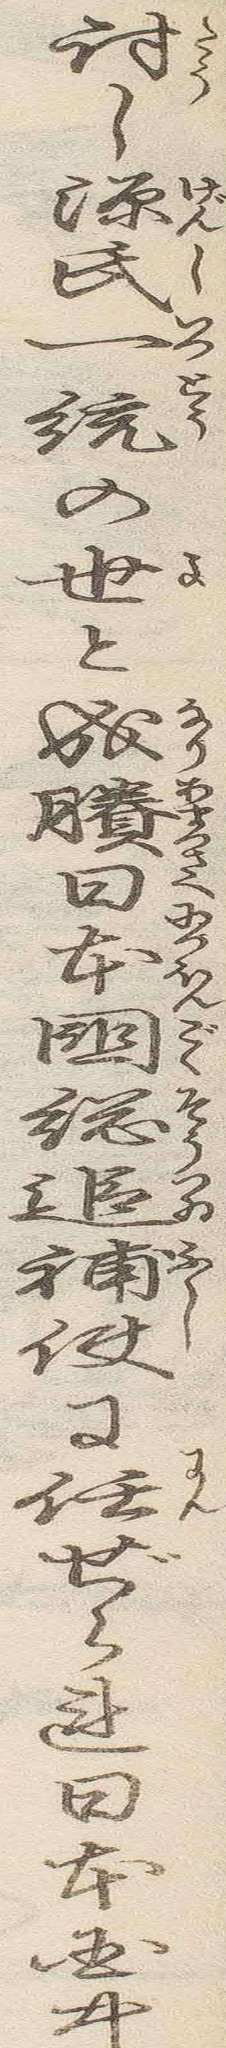討し源氏一統の世と成賸日本國総追捕使に任ぜられ日本国中
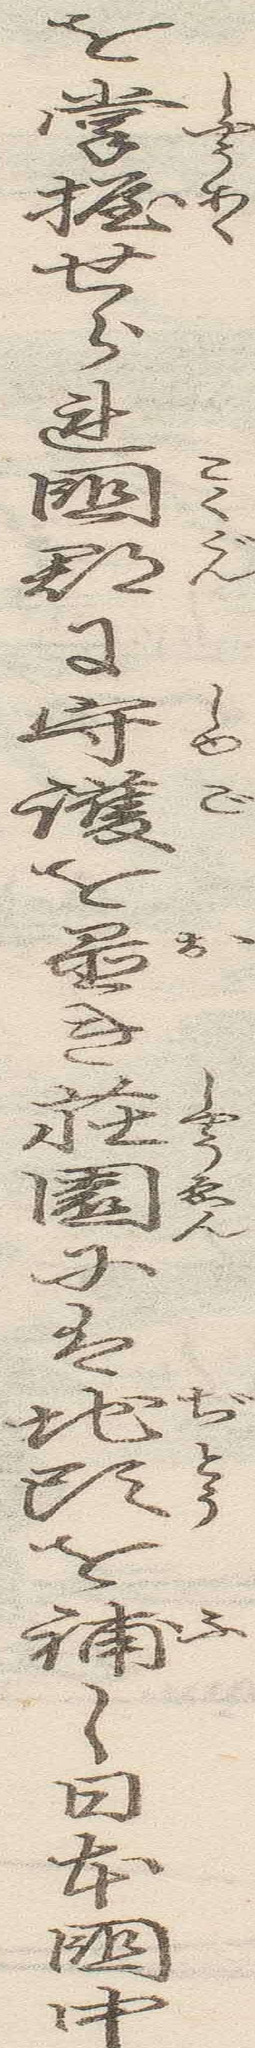を掌握せられ國郡に守護を置き荘園には地頭を補し日本國中
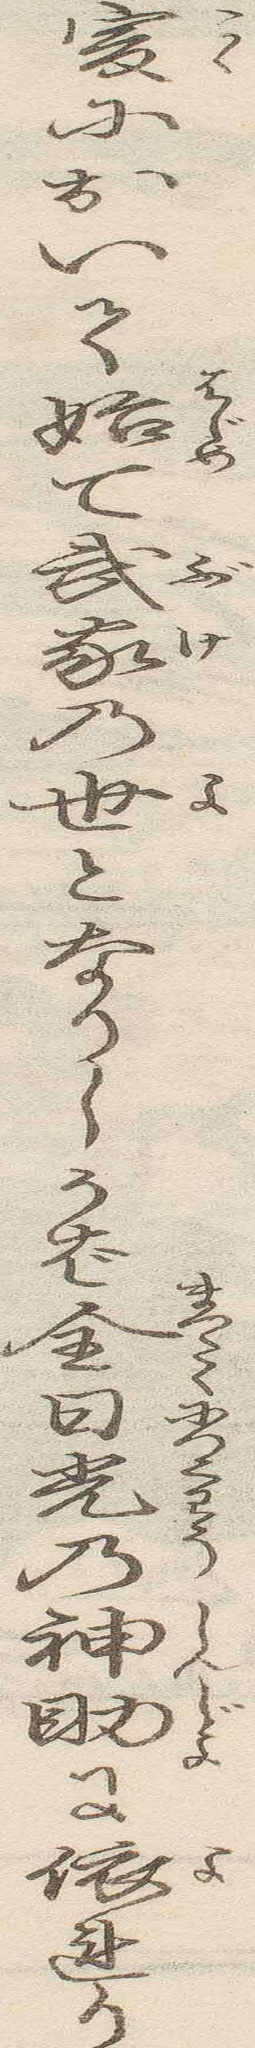爰において始て武家の世となりしかば全日光の神助に依れり
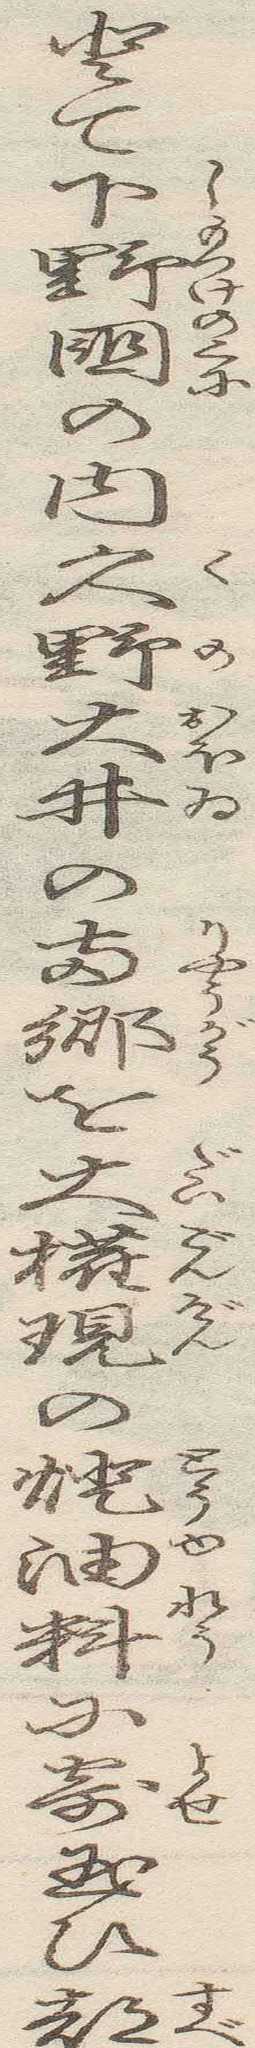とて下野國の内久野大井の両郷を大權現の燈油料に寄玉ひ都
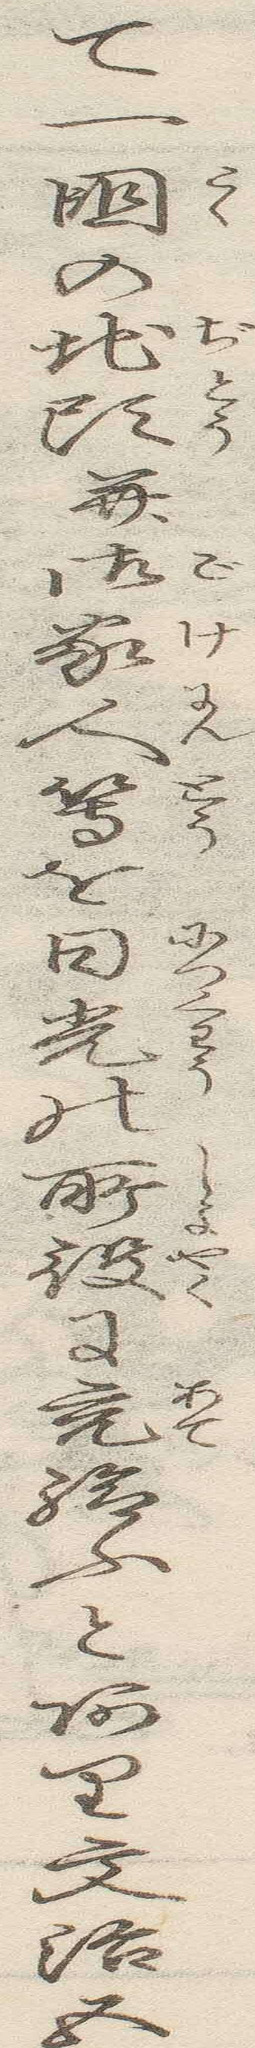て一國の地頭兼御家人等を日光の所役に充給ふとあり文治五
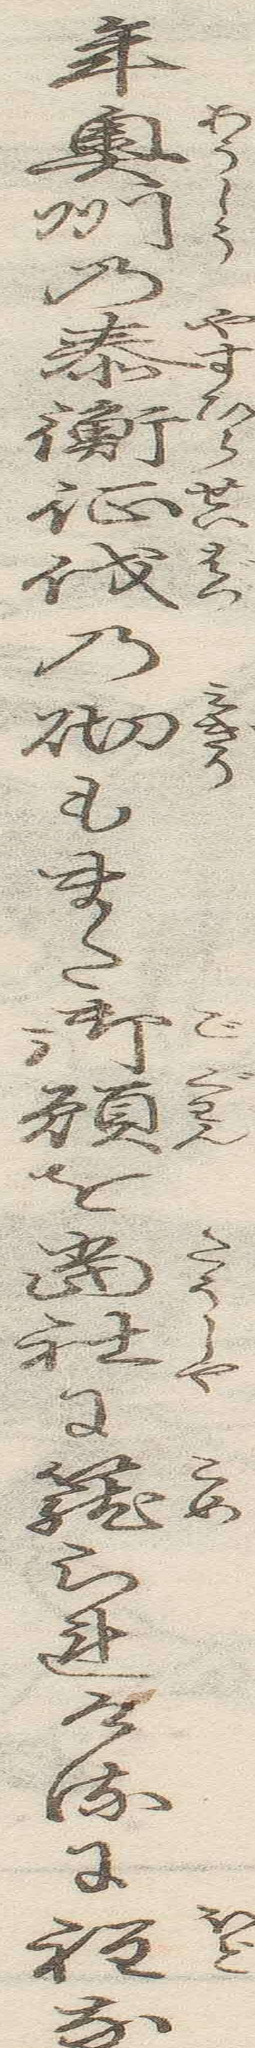年奥州の泰衡征伐の砌もまた御願を當社に籠られけるに程な
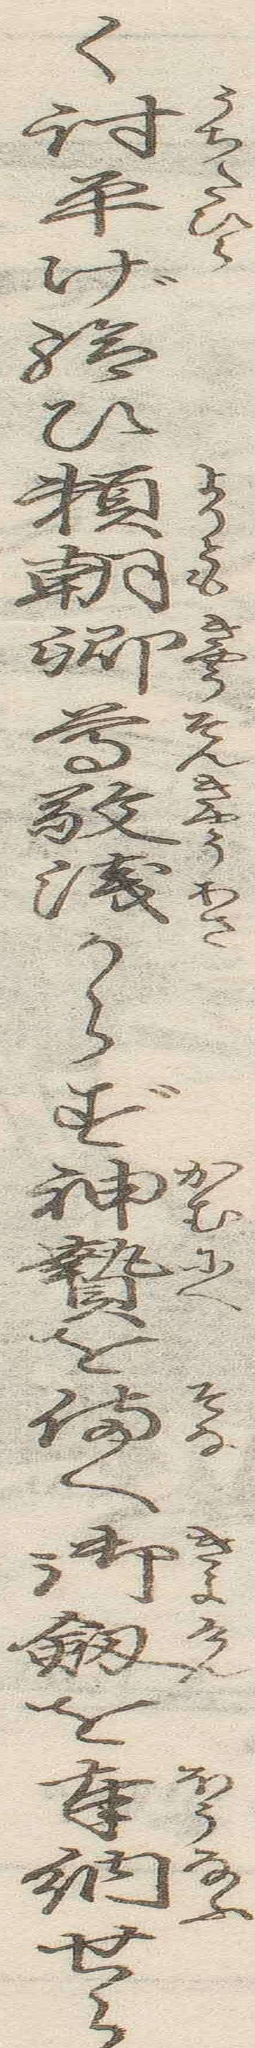く討平げ給ひ頼朝卿尊敬浅からず神贄を備へ御剱を奉納せら
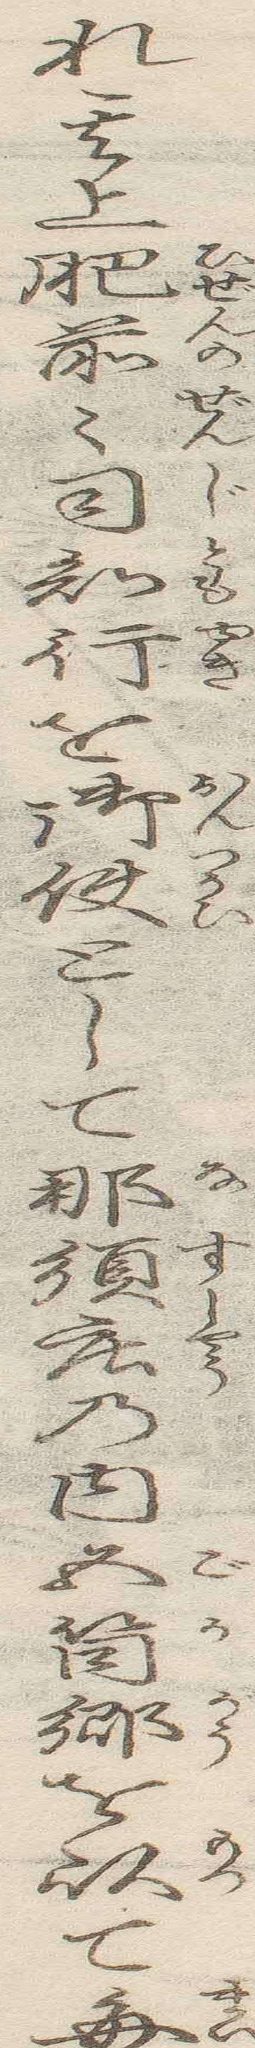れ其上肥前〻司知行を御使として那須庄の内五箇郷を以て毎
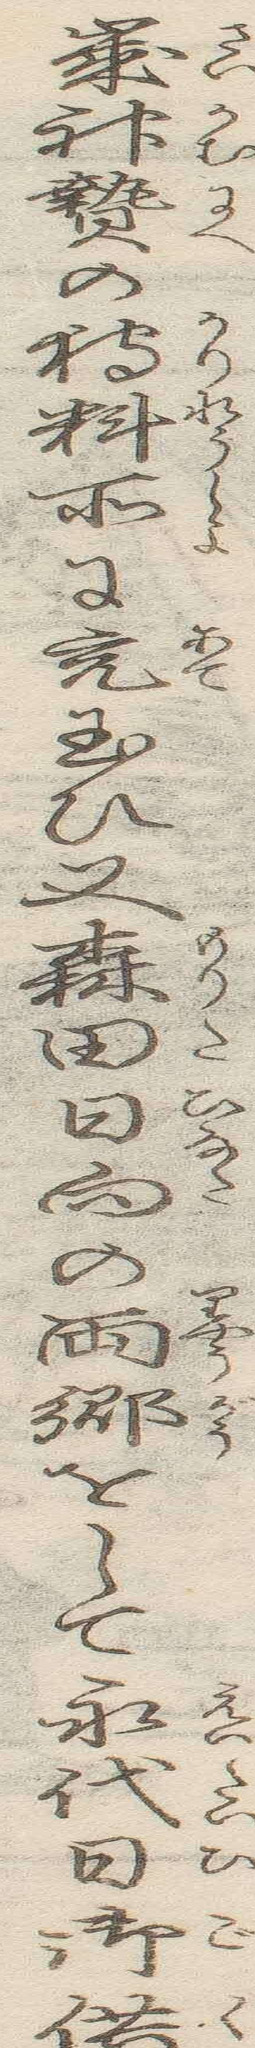歳神贄の狩料所に充玉ひ又森田日向の両郷をして永代日御供
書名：日光山志
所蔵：東京学芸大学附属図書館 国文学研究資料館
